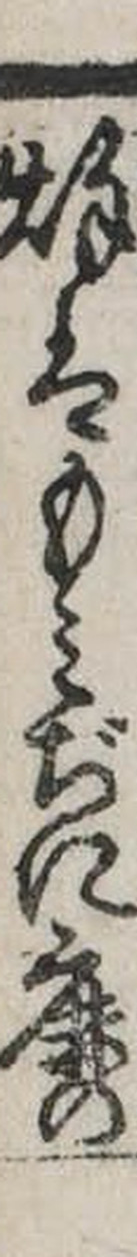秌はもみぢに鹿の
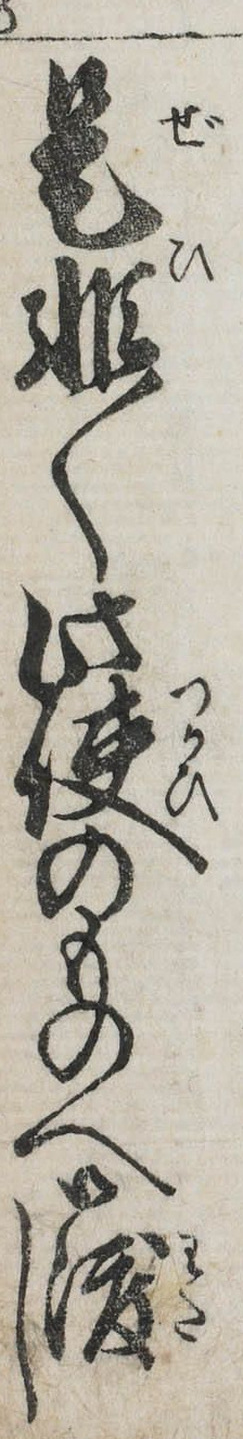是非〳〵此使のものへ御渡し

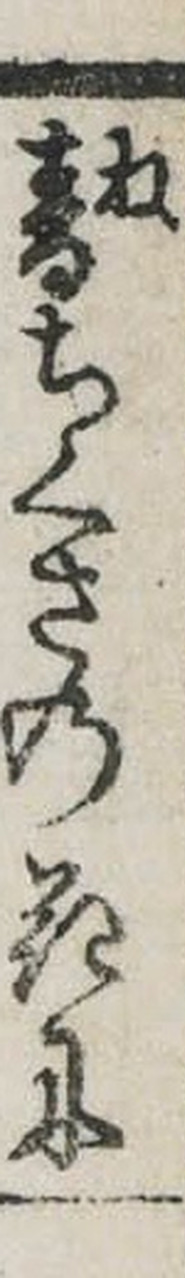音ちくさの花に
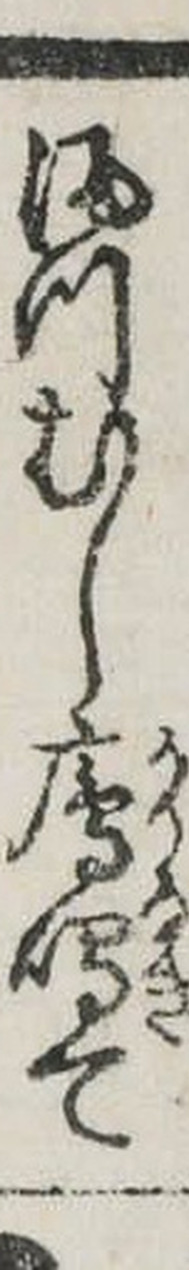まつむし鳫鳴て
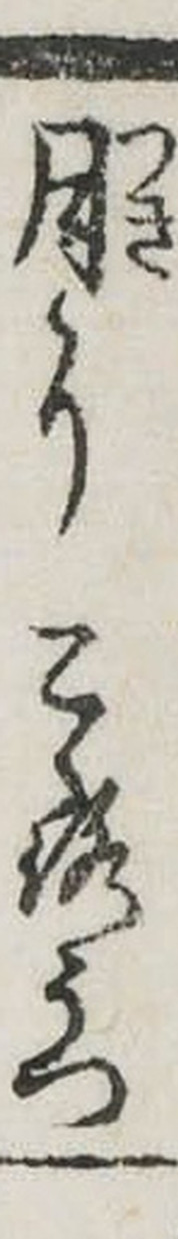月にこゝろうつ
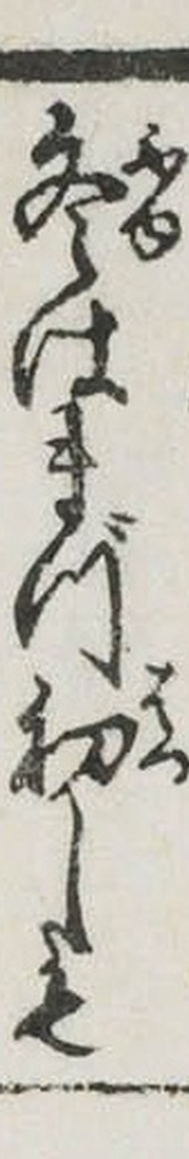冬はまづ初しも
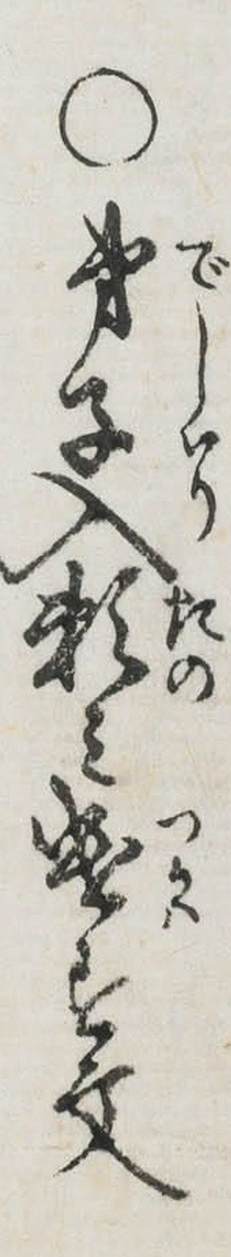○弟子入頼み遣す文
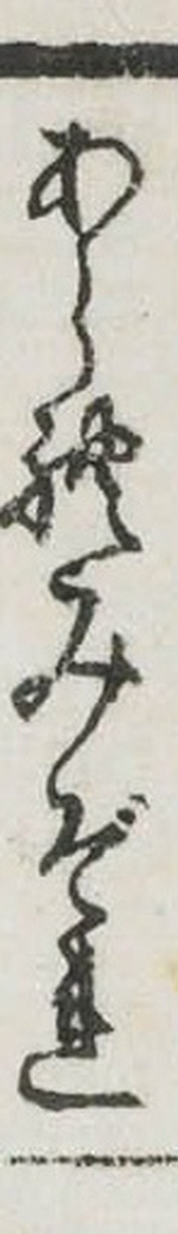あられみぞれ
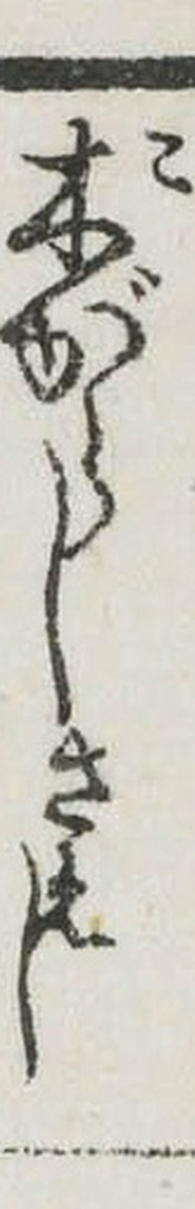木がらしさえし
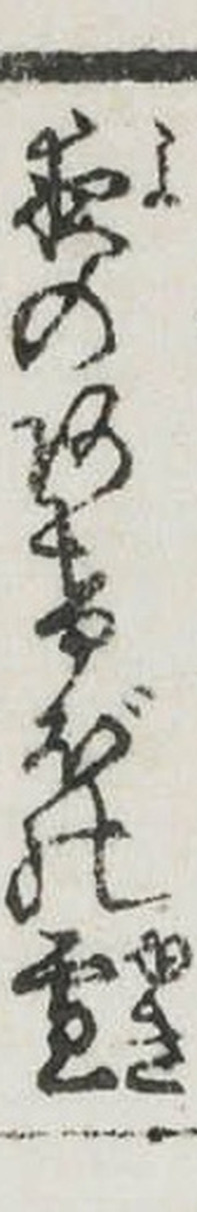夜のあけぼの雪
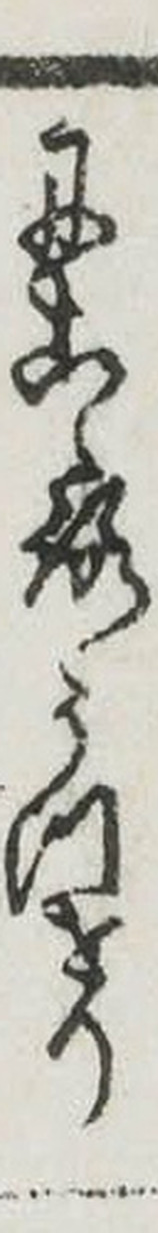にこゝろうつせり
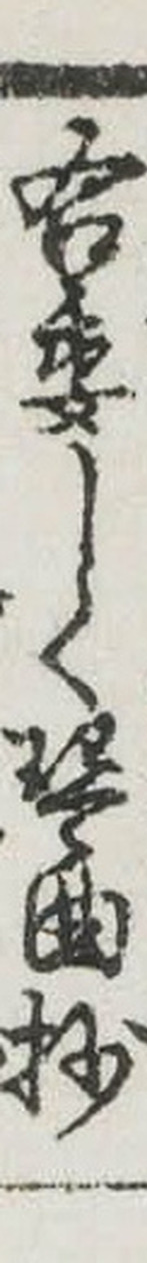各委しく琴曲抄
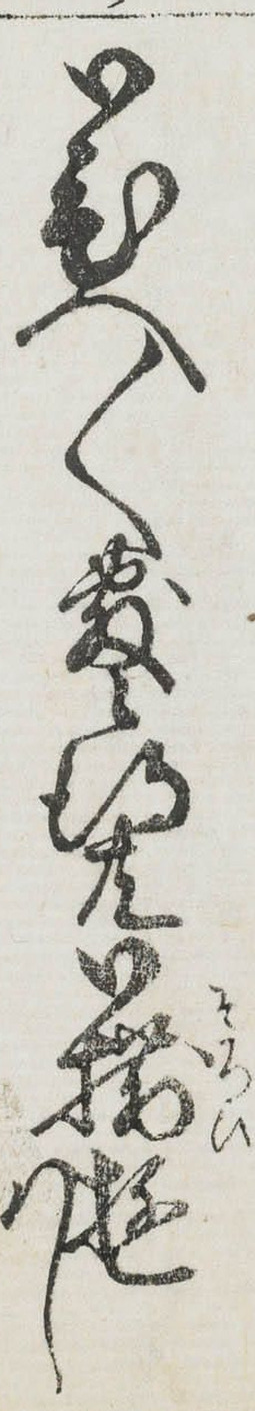御ひへ〳〵敷候得共御揃遊はし
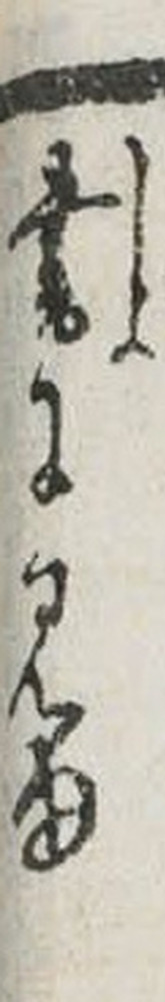書に見る
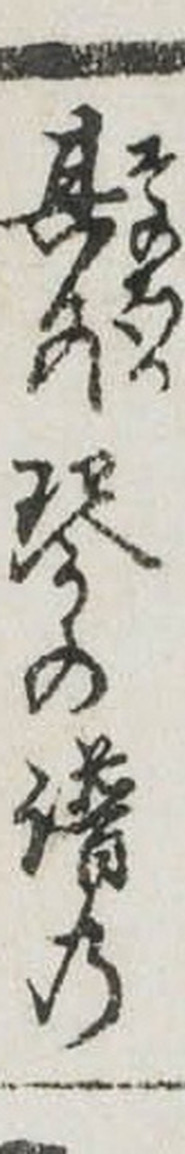其外琴の譜の
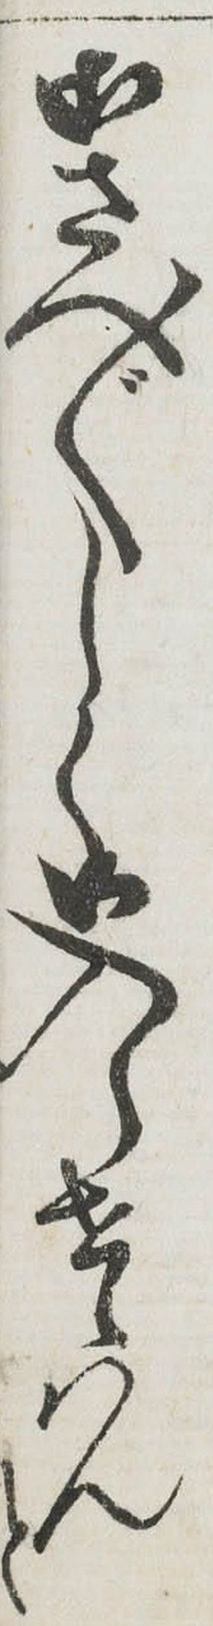御さへ〴〵しく御入らせ候はんと
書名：頭書萬用婦人手紙之文言
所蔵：東京学芸大学教育コンテンツアーカイブ
